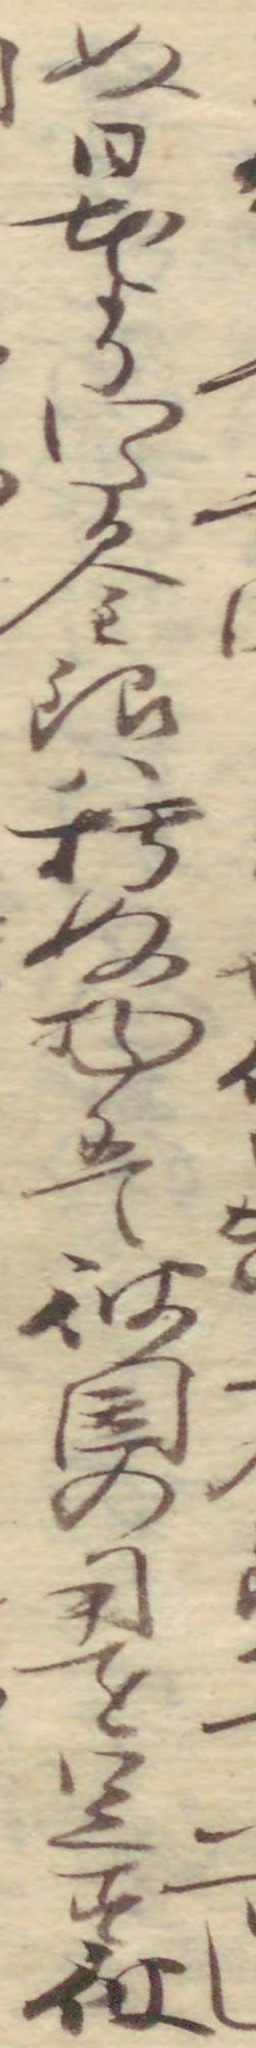ぬ日本よりわたる金銀は朽ぬ物にて彼国の用を足す彼
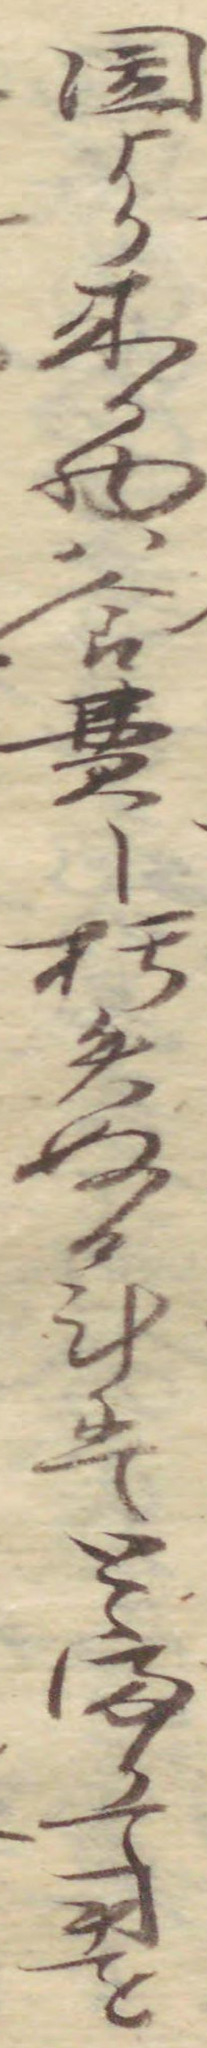国より来る物は食費し朽失ぬる計にてとゝまりて用を
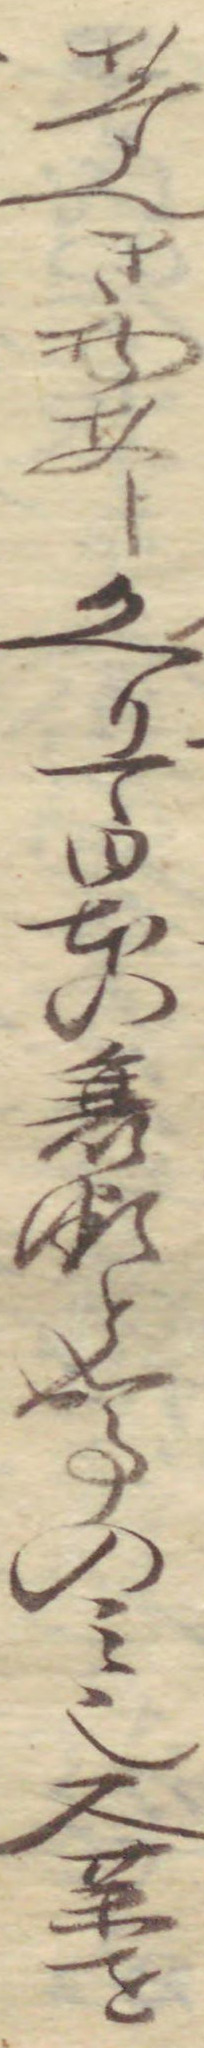なすへき物なしかへりて日本の衰微と成事のみ也又薬を
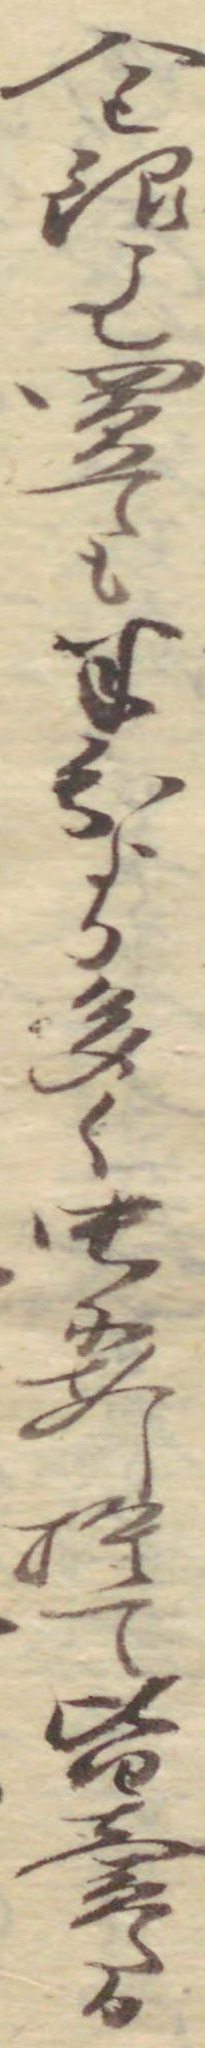金銀ニて買ても半分より多く虫になし捨て皆売たる
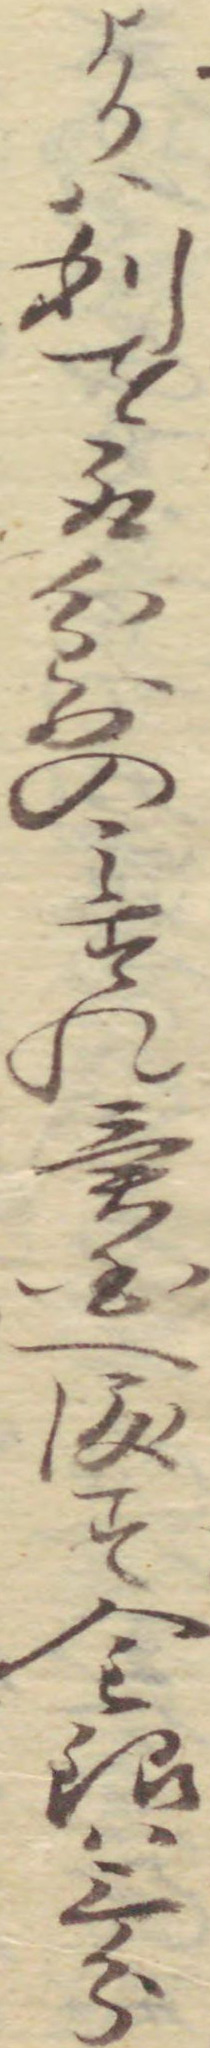よりは利を取分別のみすれ異国へ渡す金銀は三分
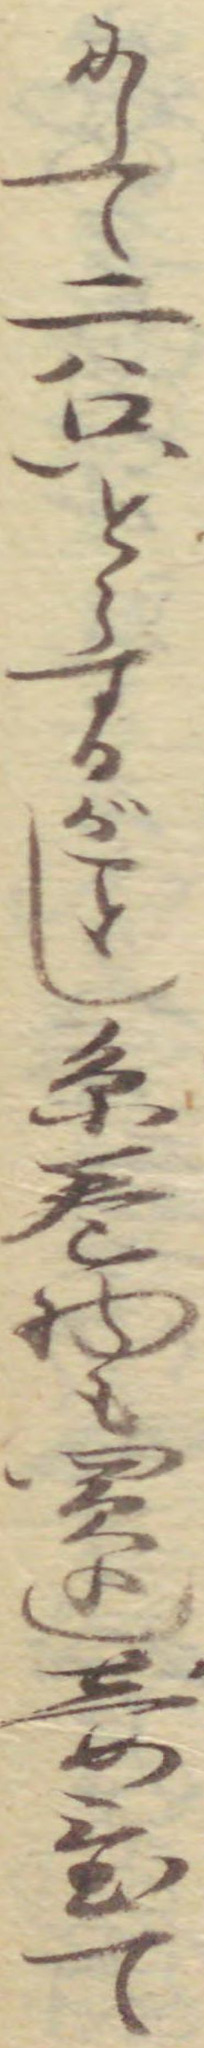にて二は只とらするがことし糸巻物も買込しめ置て
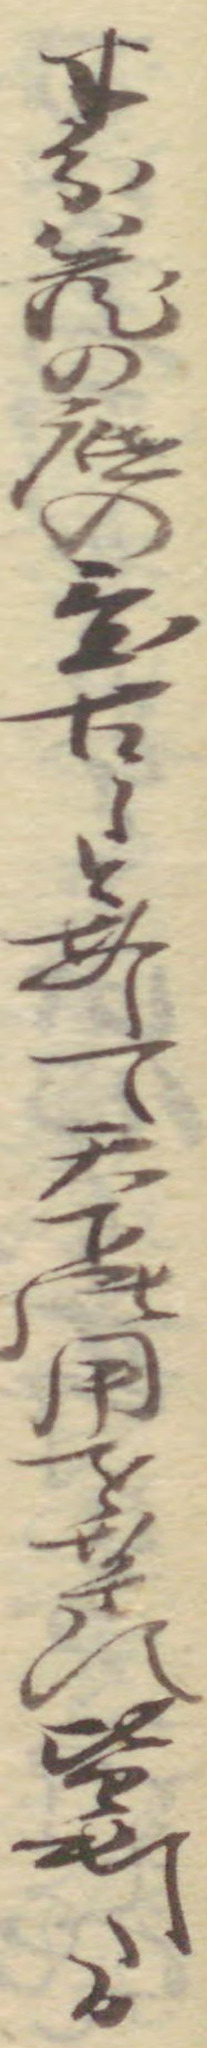半分は蔵の底の置古しとなして天下の用をなさす皆出したる
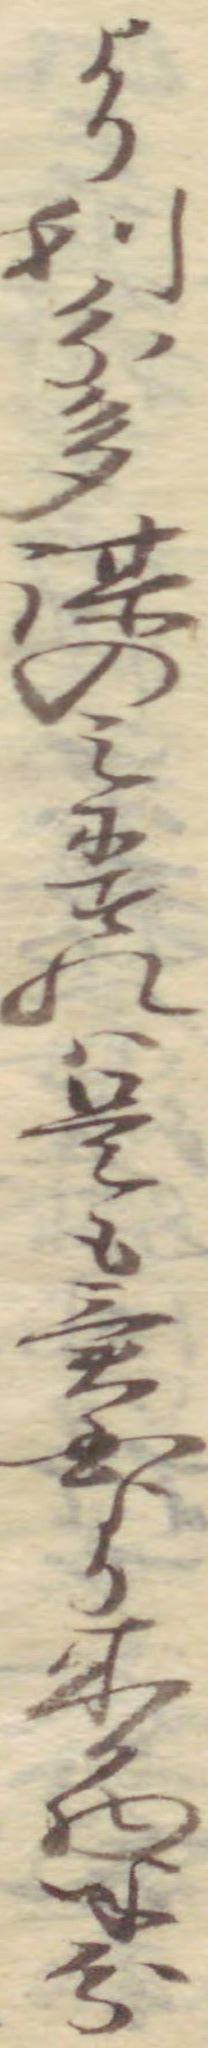より利分多謀のみにすれは是も異国より来る物半分
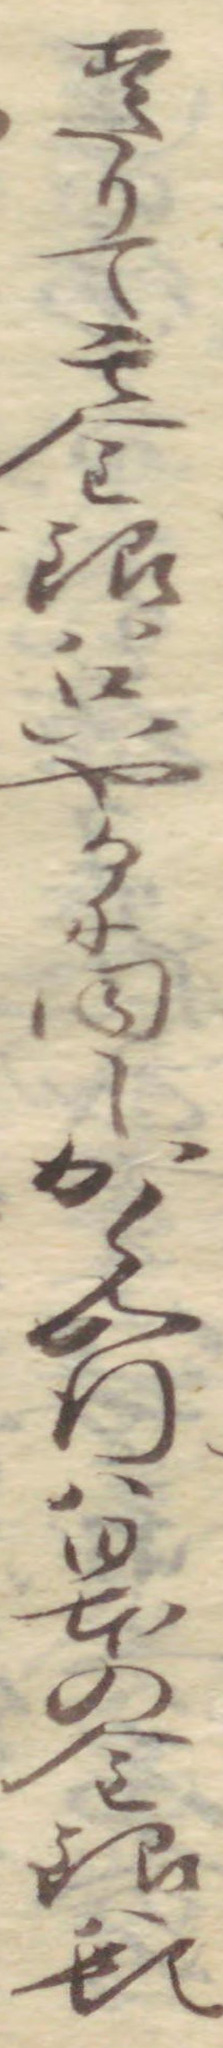すたりて其金銀は只やるに同しかく成行は日本の金銀は頓
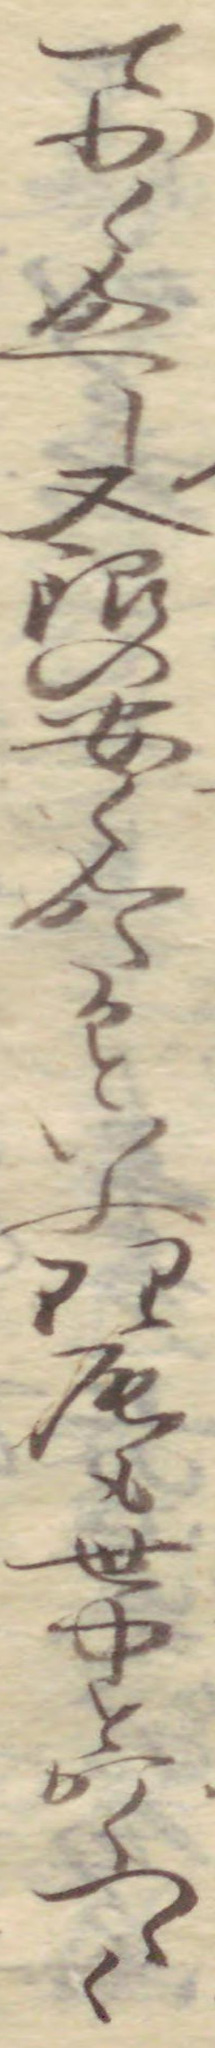て少く成へし又銀の安く成たるといふ理屈も世中とかくつゝく
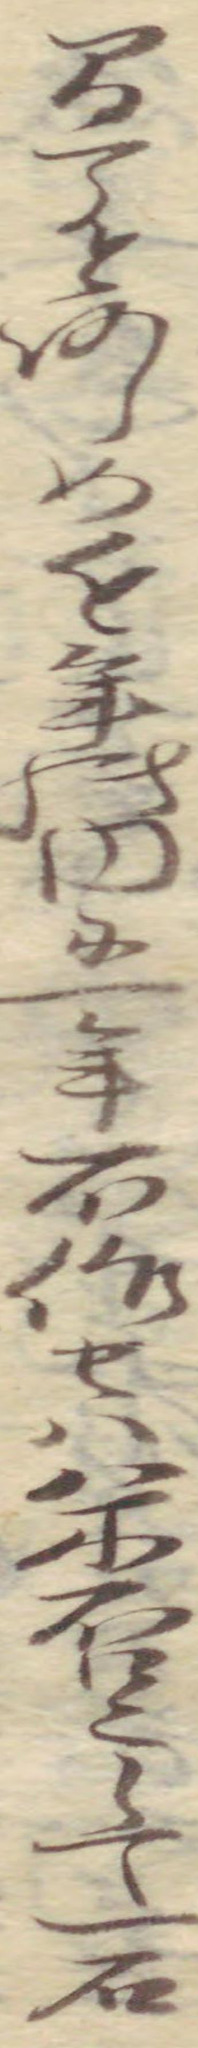間こそあらめ近年の内に一年不作せは米不足して一石
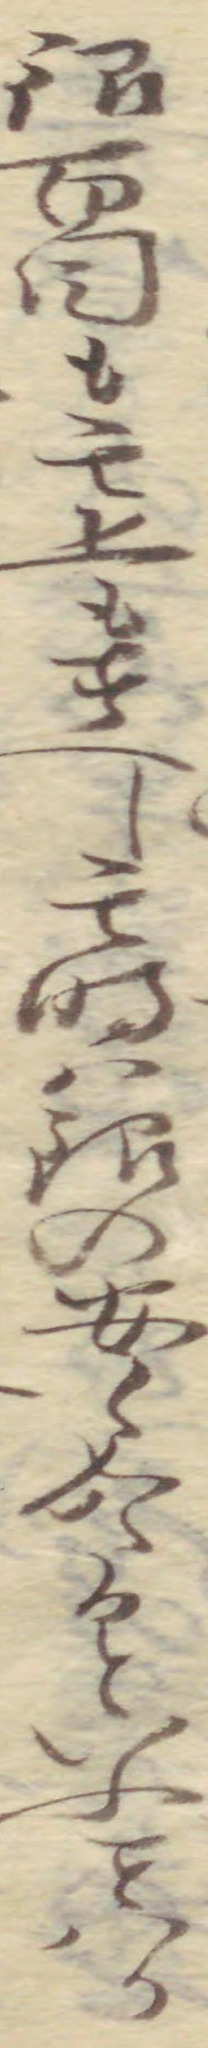銀百目も其上もすへし其時は銀の安く成たるといふことはり
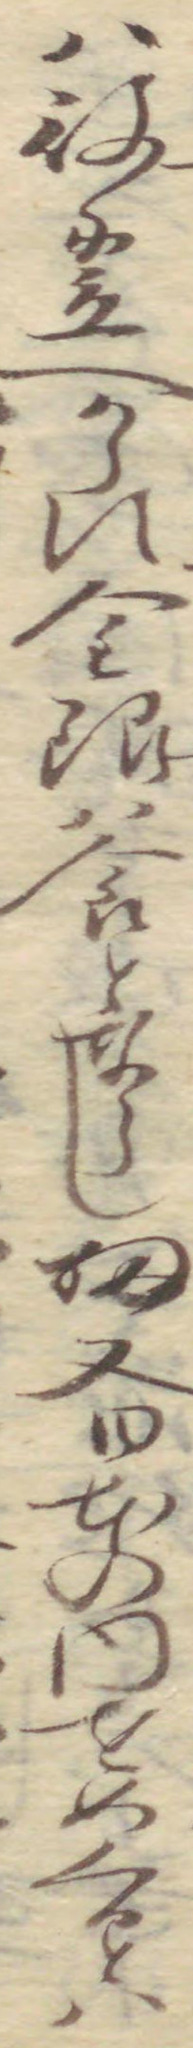は役に立へからす金銀は食とならし扨又日本の内をめくるとは
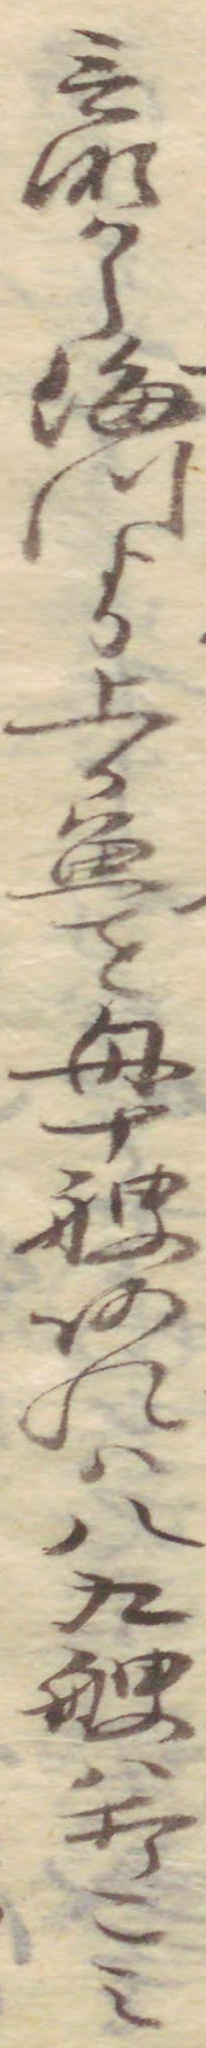言なから海川より上る魚を舟十艘あれは八九艘は打こみ
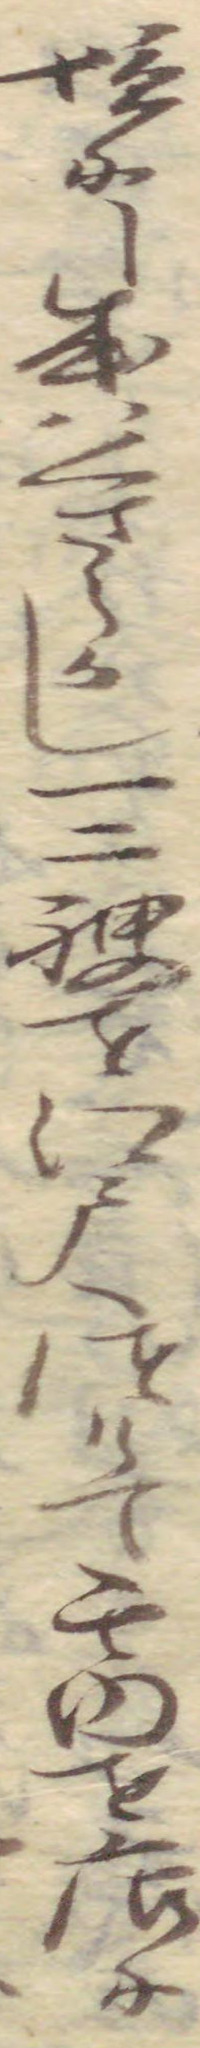塩にし或はくさらかし一二艘を江戸へつけて其内を店に
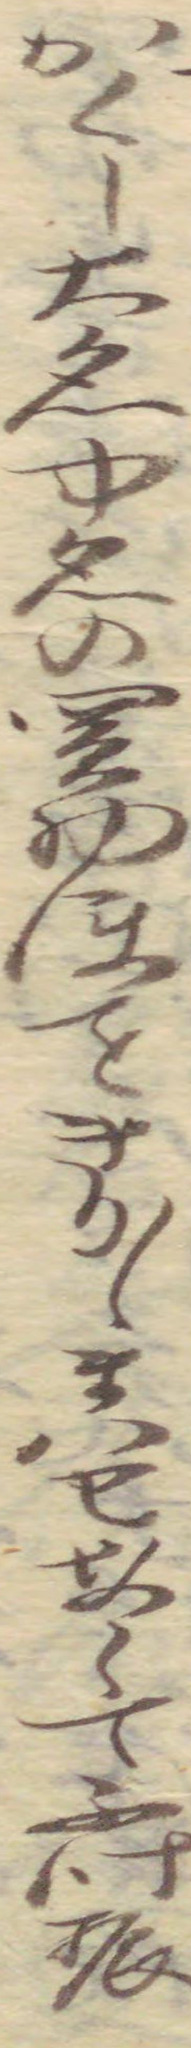かくし大名中名の買物使をきり〳〵まはせなくて不叶振
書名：鶯宿雑記. 巻263-264
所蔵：国立国会図書館 National Diet Library, JAPAN
